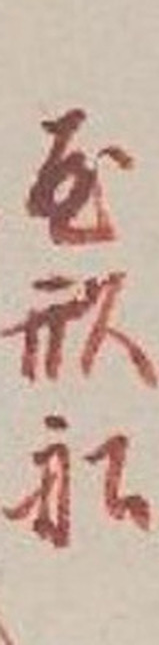屋形船
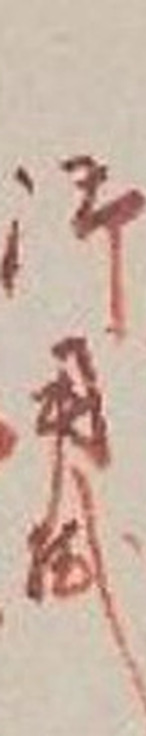御用掛
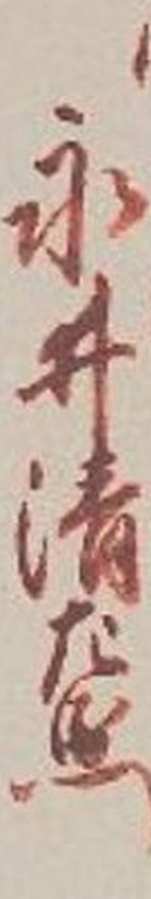長井清左衛門

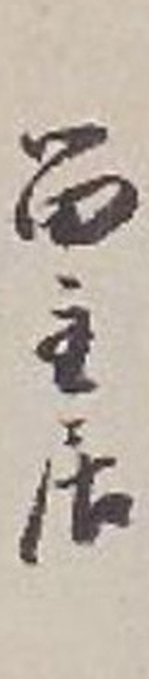留守居
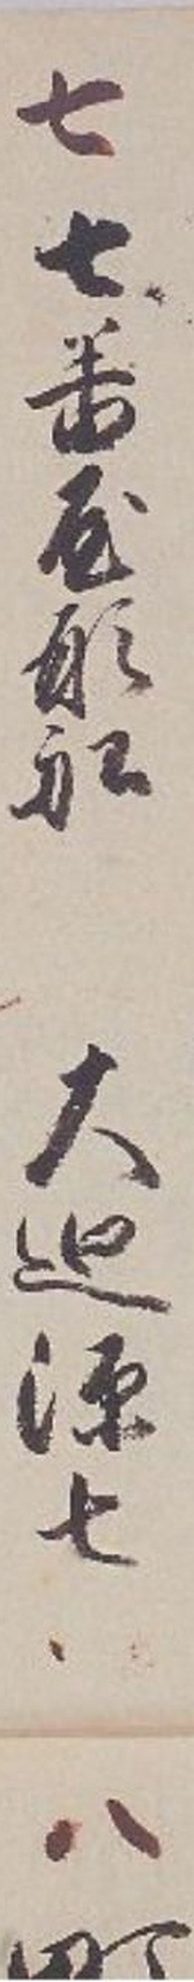七七番屋形船大廻源七

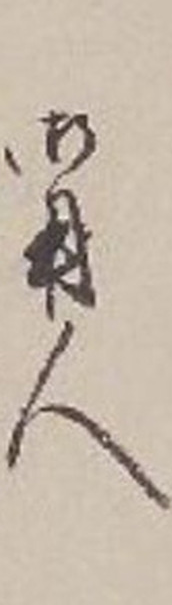御用人

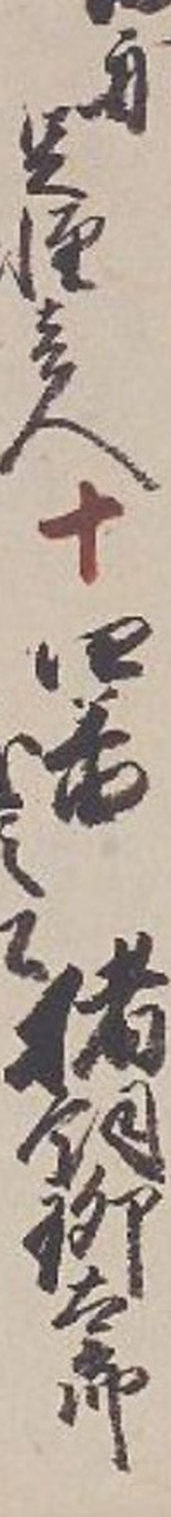足軽壱人十四番猪飼鉚太郎
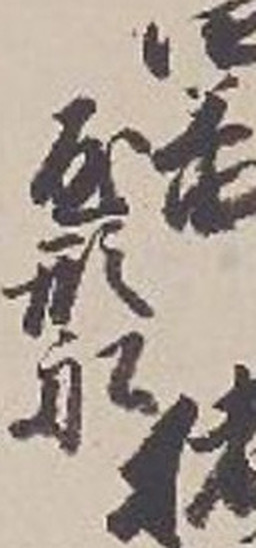屋形船
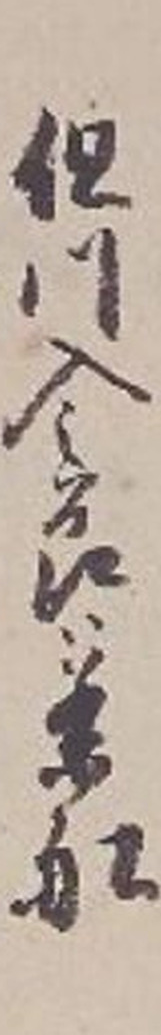但川入之節は茶船
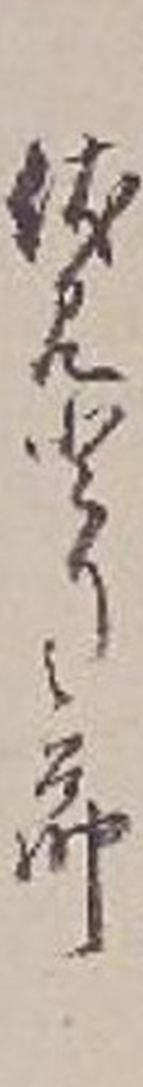伏見登り之節
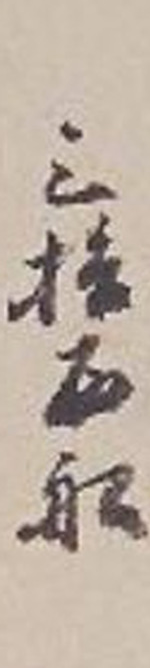三拾石船

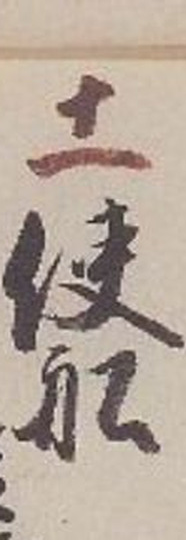十一使船
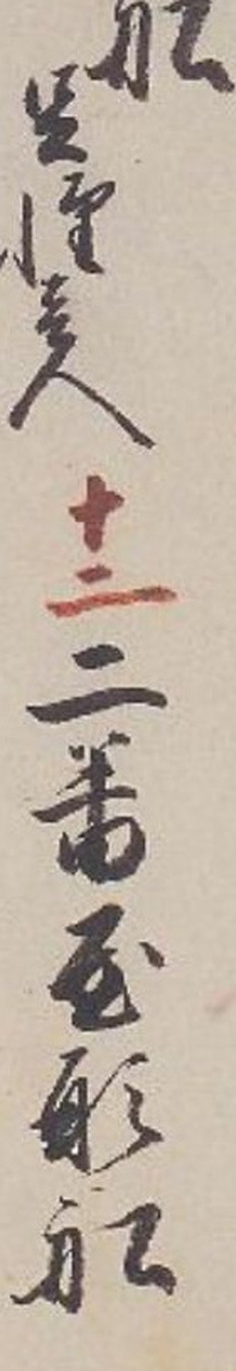足軽壱人十二二番屋形船
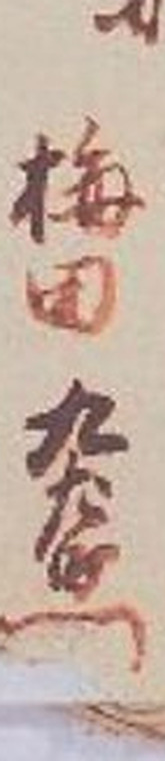梅田九左衛門

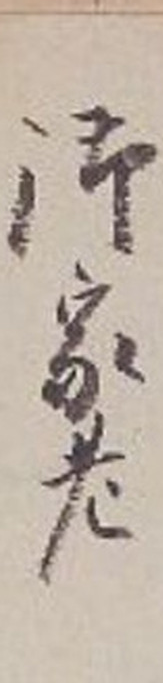御家老
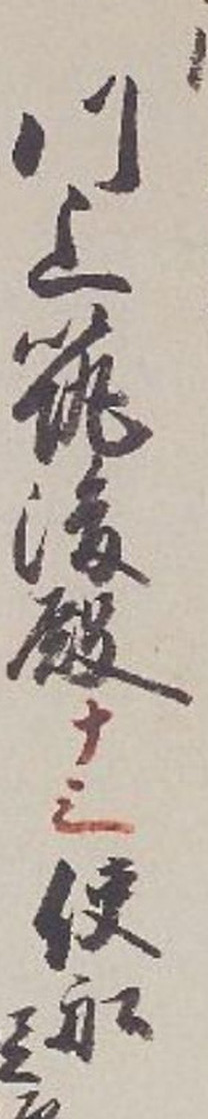川上筑後守殿十三使船
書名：琉球人就来府淀川筋船行列帳 但木津川より大阪御屋敷迄並其外一巻
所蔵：University of the Ryukyus Library
